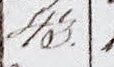43.
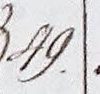49.
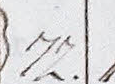72.
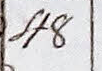48
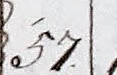57.
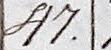47.
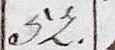52.
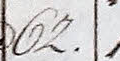62.
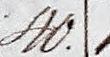40.
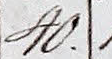40.
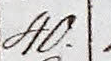40.
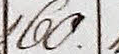60.
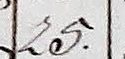25.
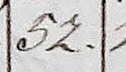52.
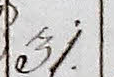31.
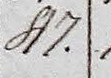47.
